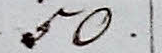50.
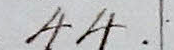44.
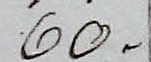60
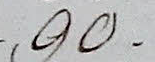90
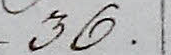36.
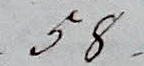58
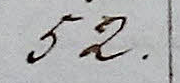52.
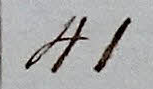41
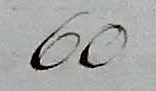60
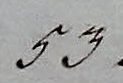53
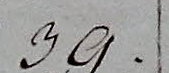39.
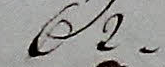62
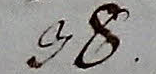38
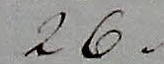26
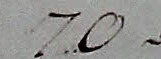70
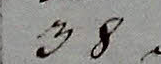38
